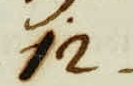12
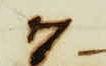7
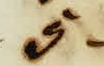5
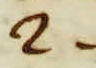2
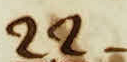22
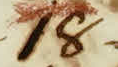18
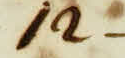12
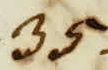35
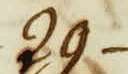29
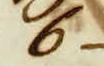6
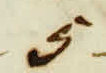5
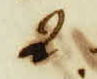2
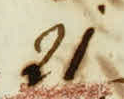21
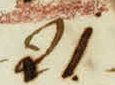21.
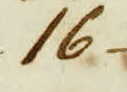16
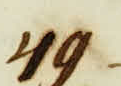49
